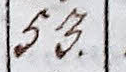53.
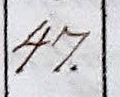47.
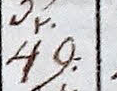49.
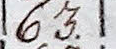63.
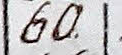60.
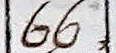66
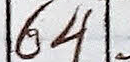64
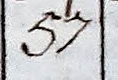57
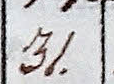31.
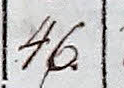46.
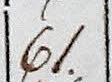61.
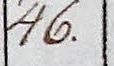46.
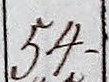54
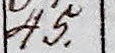45.
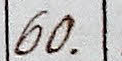60.
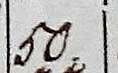50
